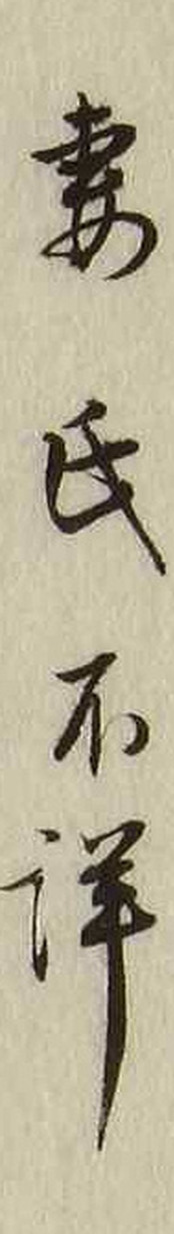妻氏不詳
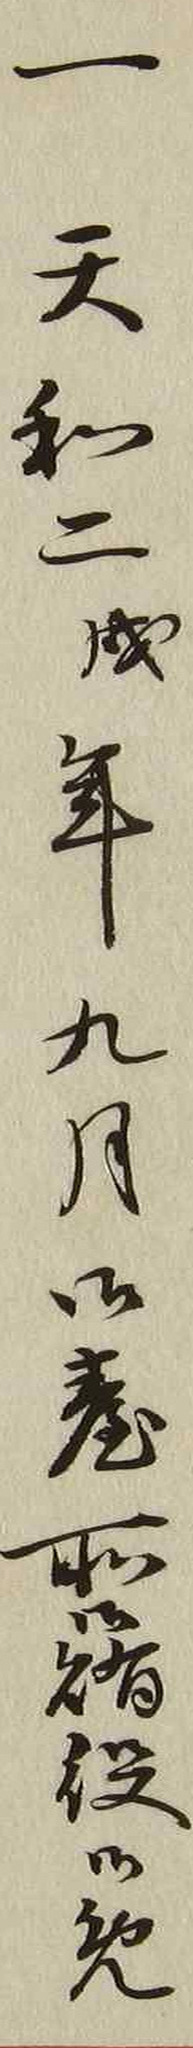一天和二戌年九月御台所御賄い役御免
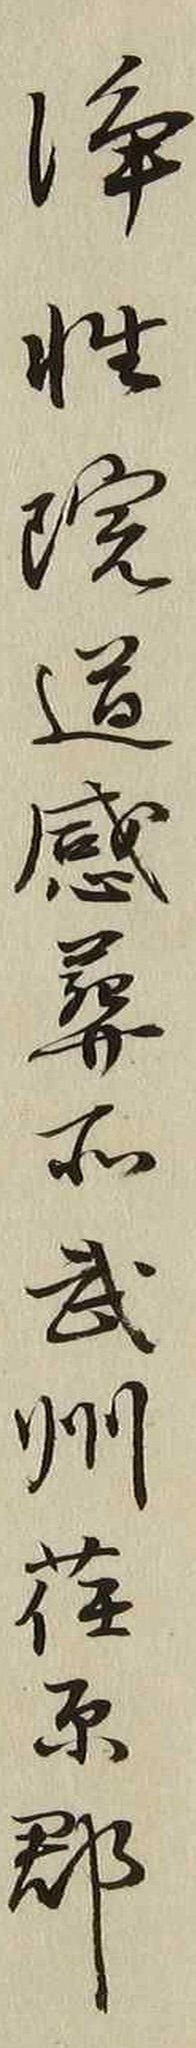浄性院道感葬所武州荏原郡
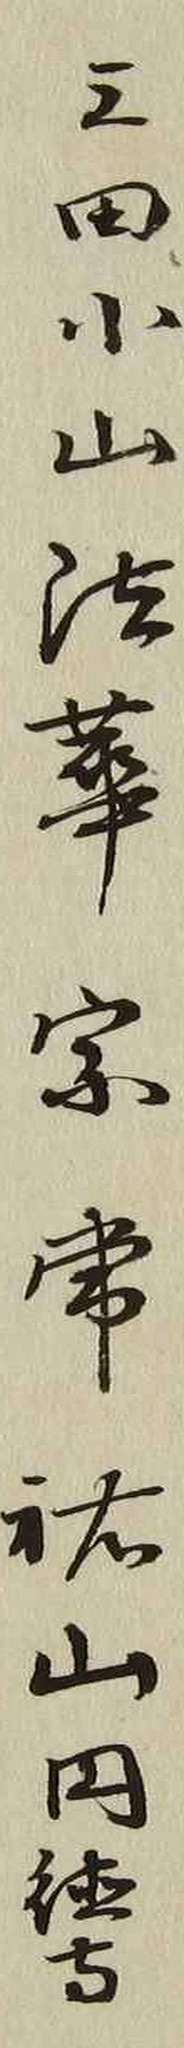三田小山法葬宗常佑山円徳寺
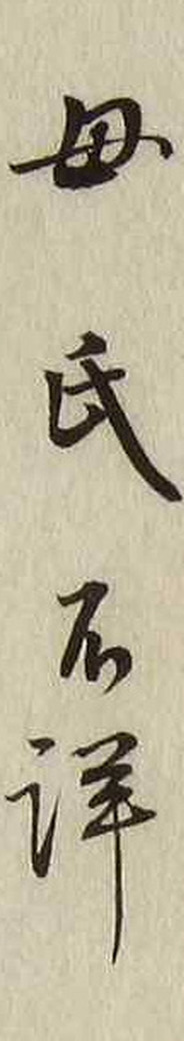母氏不詳
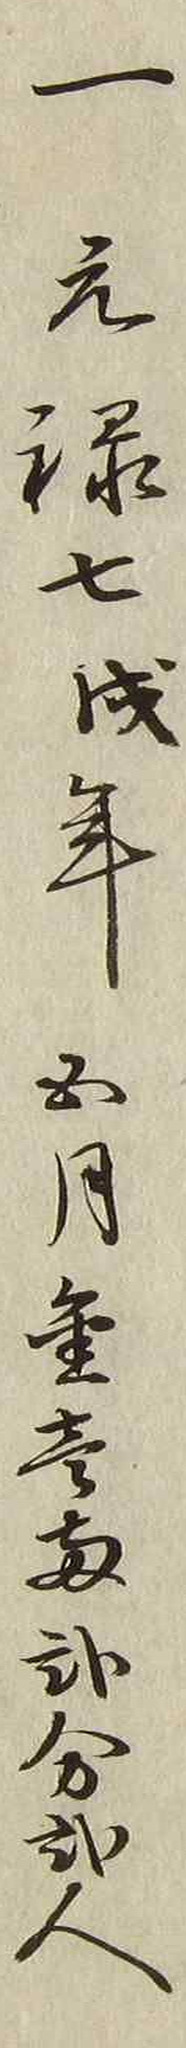一元禄戌年五月金壱両弐弐人

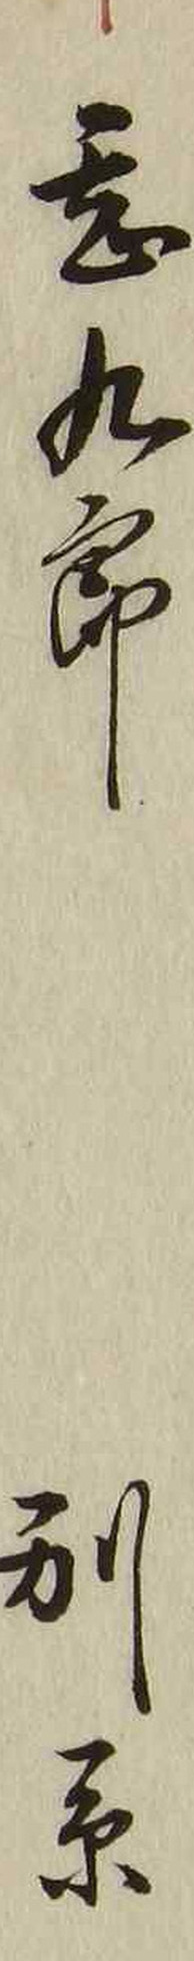甚九郎別系
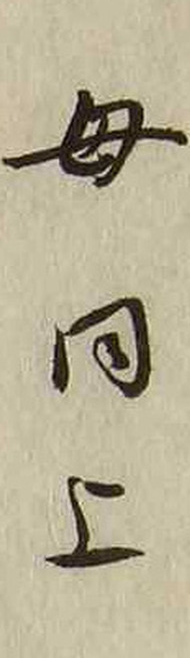母同上
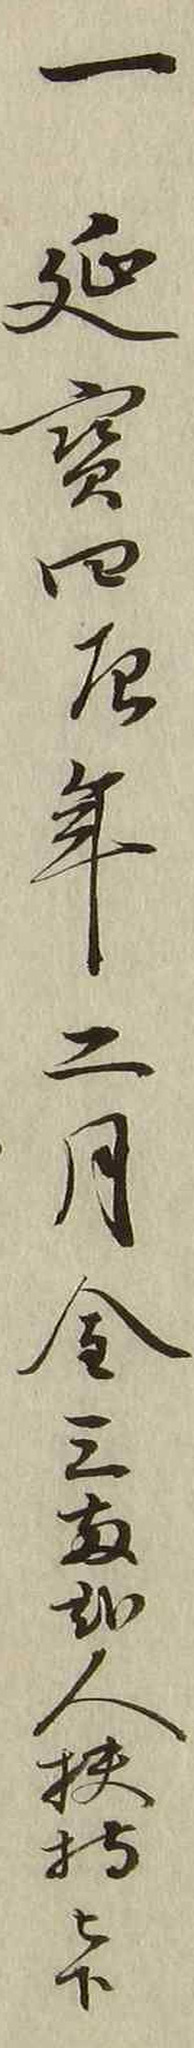一延宝辰年二月金両弐人扶持下し
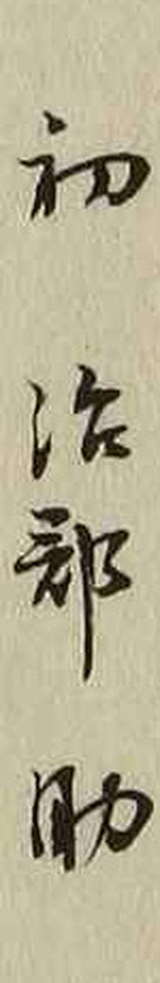初治部助
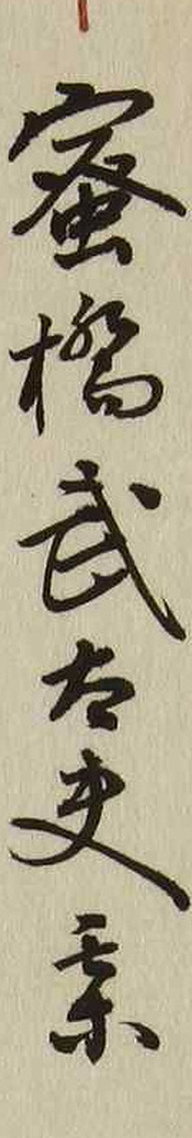密橋武太夫
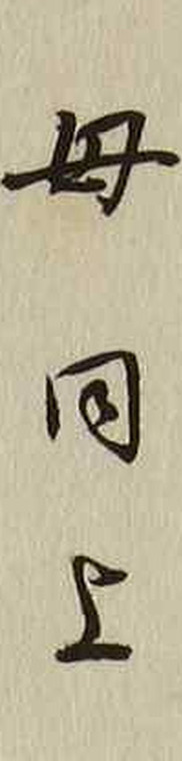母同上
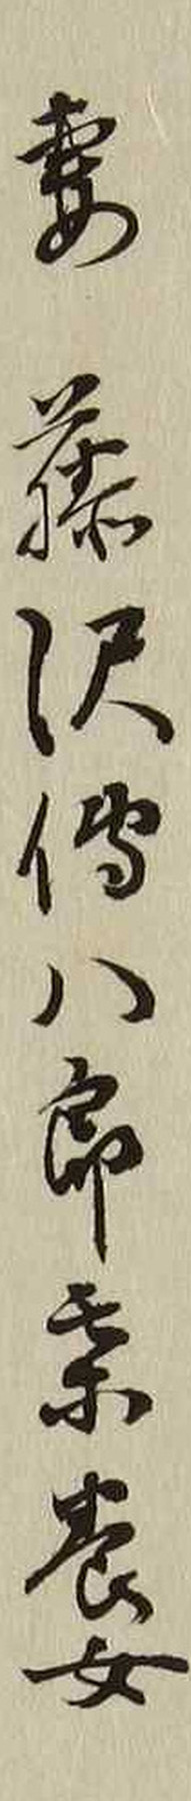妻藤沢傳八郎某養女
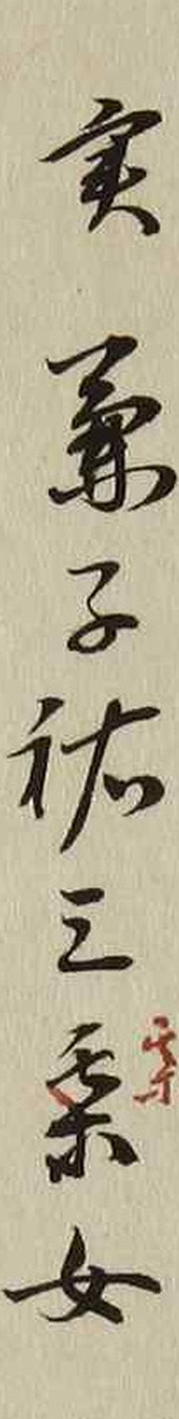実兼子祐三某女
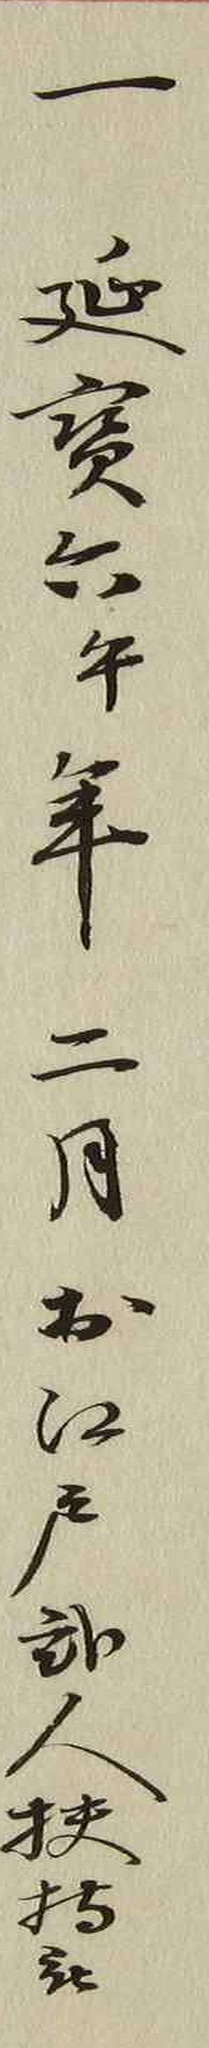一延宝六午年二月江戸ニ於いて弐人扶持
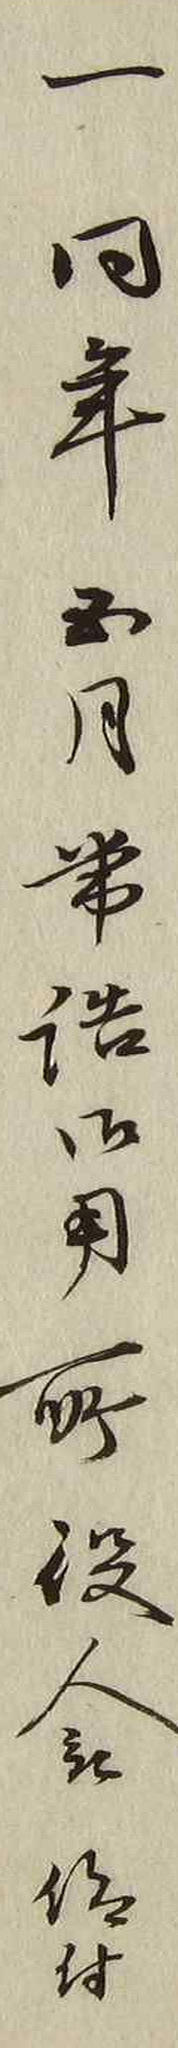一同年五月常詰御用所仰せ付けられ
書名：諸士系譜　巻之16　い之部16
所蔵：会津若松市立会津図書館
